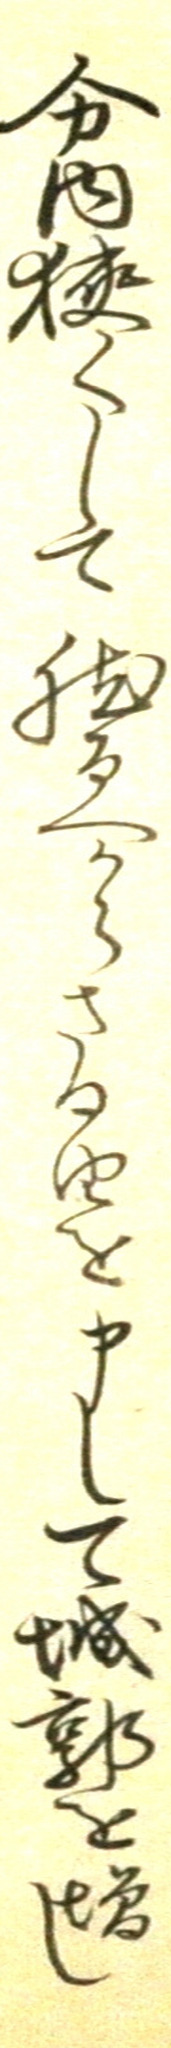分内狭くして然るへからさる由を申して城郭を増し
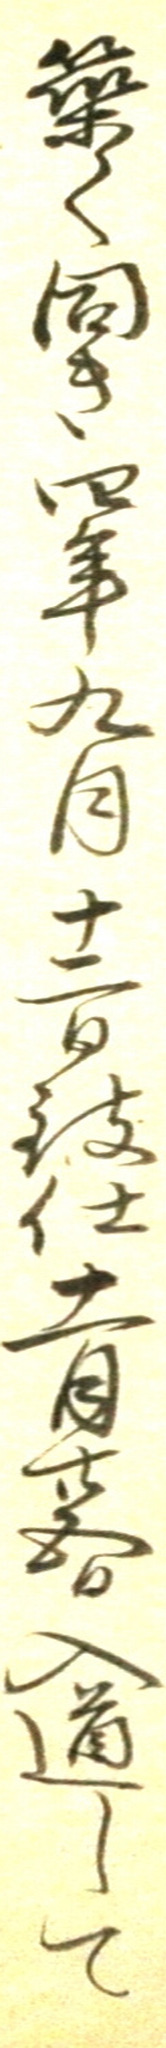築く同き四年九月十二日致仕十一月廿五日入道して
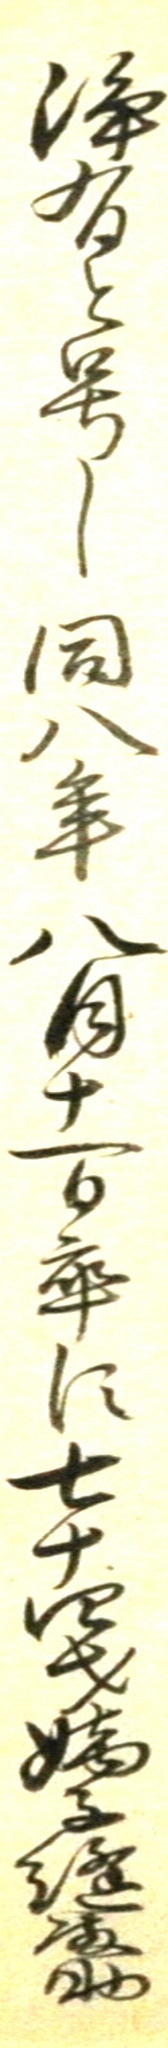浄有と号し同八年八月十一日卒す七十四才嫡子縫殿助
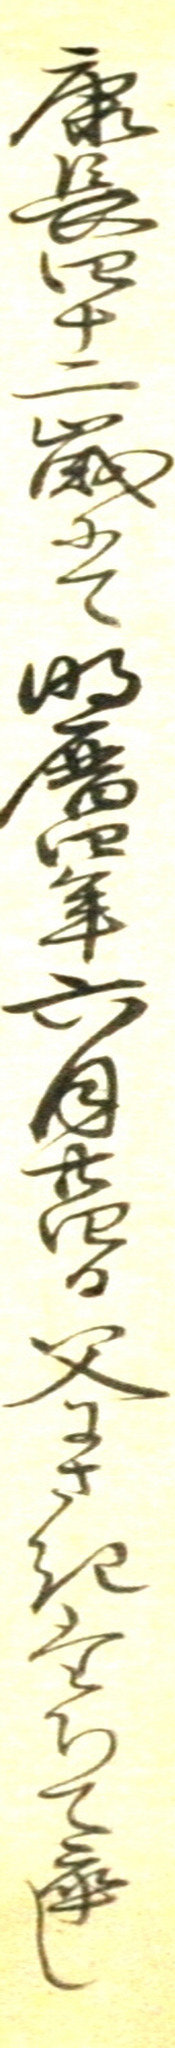康長四十二歳にて明暦四年六月廿四日父にさきたちて卒し
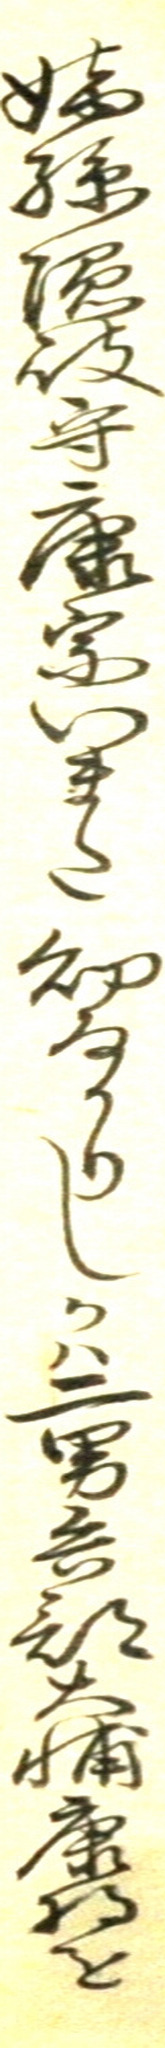嫡孫隠岐守康宗いまた幼なかりしかは二男兵部大輔康将を
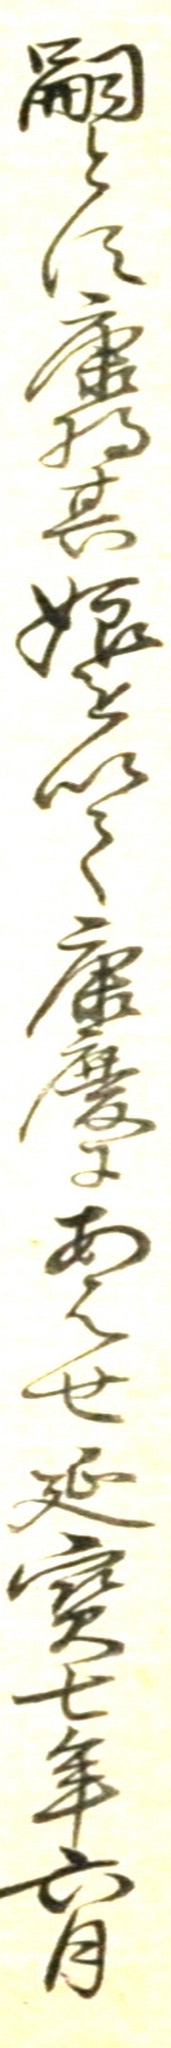嗣とす康将其娘を以て康慶にあはせ延宝七年六月
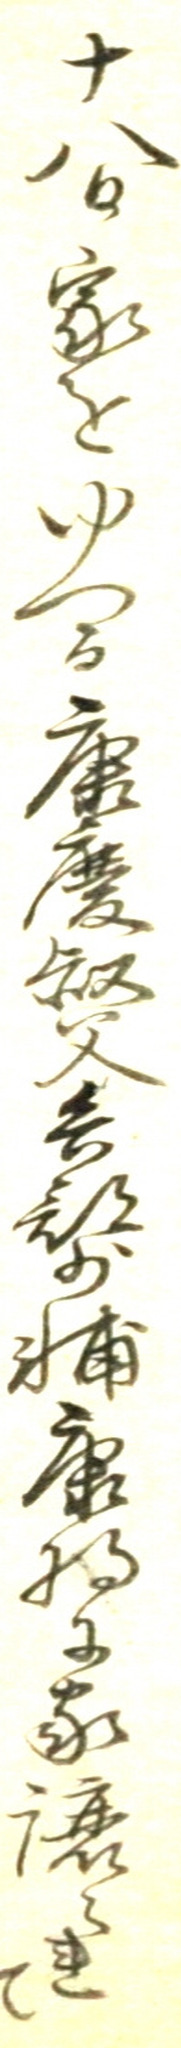十八日家をゆつる康慶叔父兵部少輔康将に家譲られて
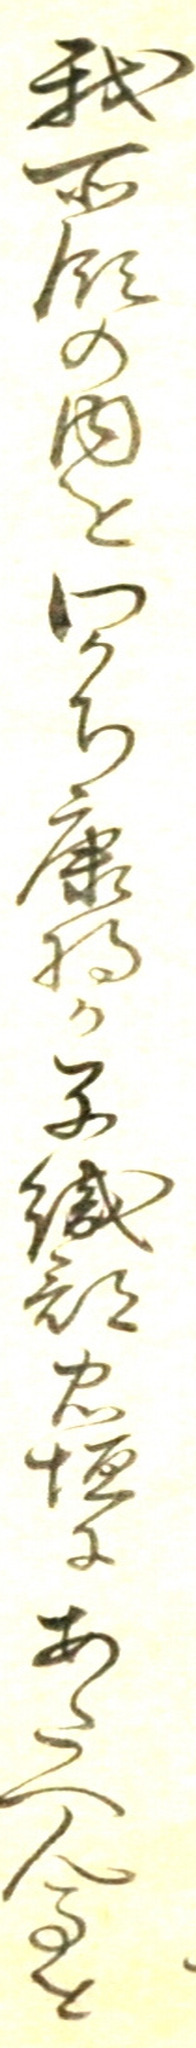我所領の内をわかち康将か子織部忠恒にあたへん事を
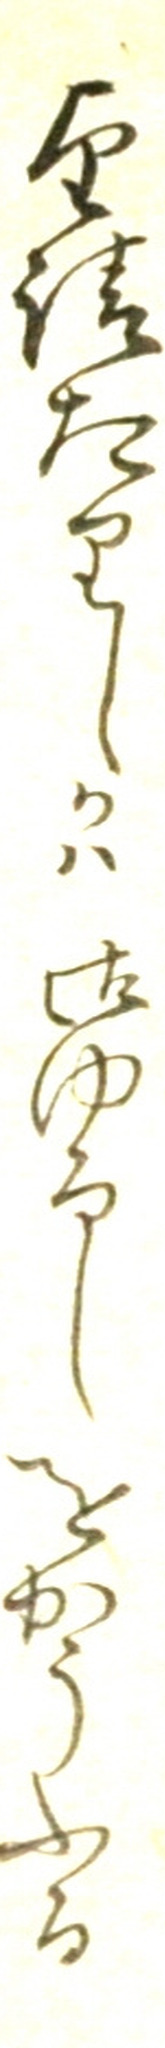望請たりしかは御ゆるしをかうふる
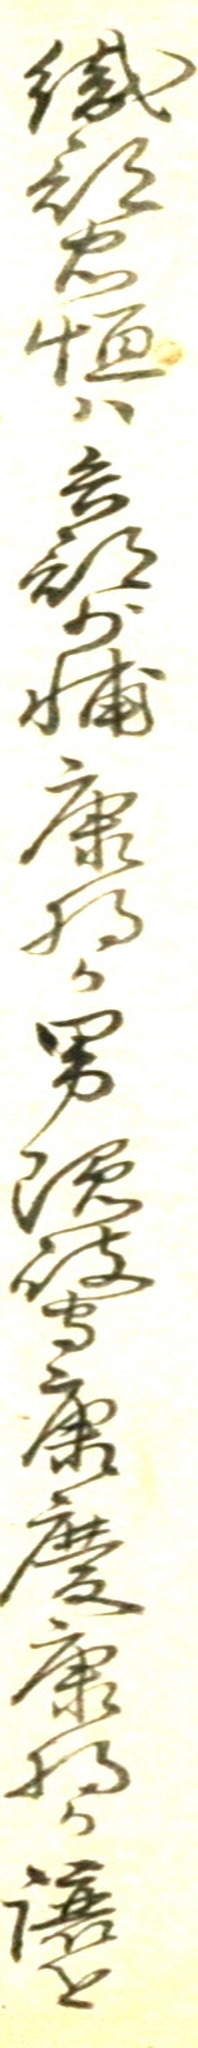織部忠恒は兵部少輔康将か男隠岐守康慶康将か譲を
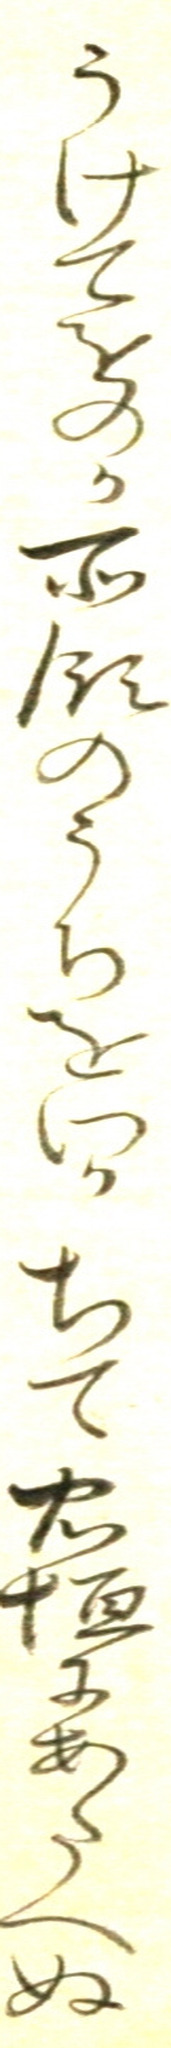うけてをのか所領のうちをわかちて忠恒にあたへぬ

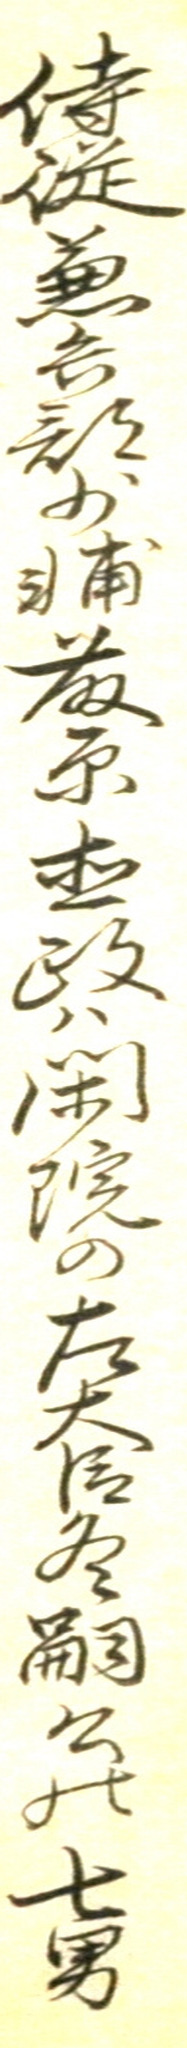侍従兼兵部少輔藤原直政は閑院の左大臣冬嗣公の七男
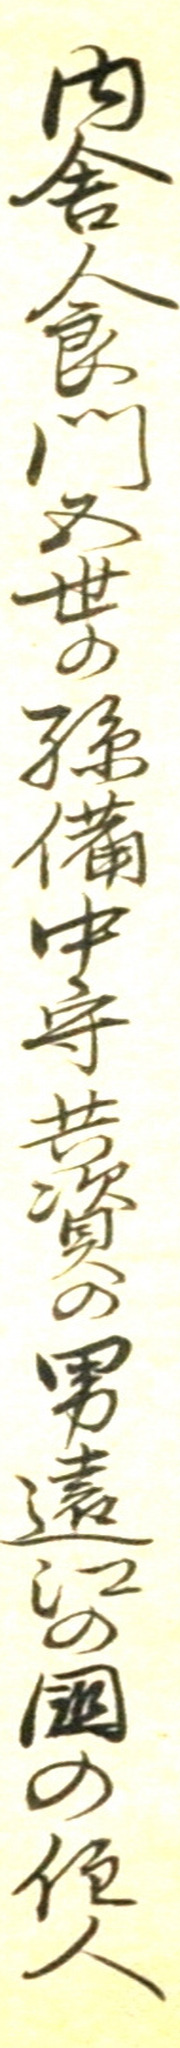内舎人良門五世の孫備中守共資の男遠江の国の住人

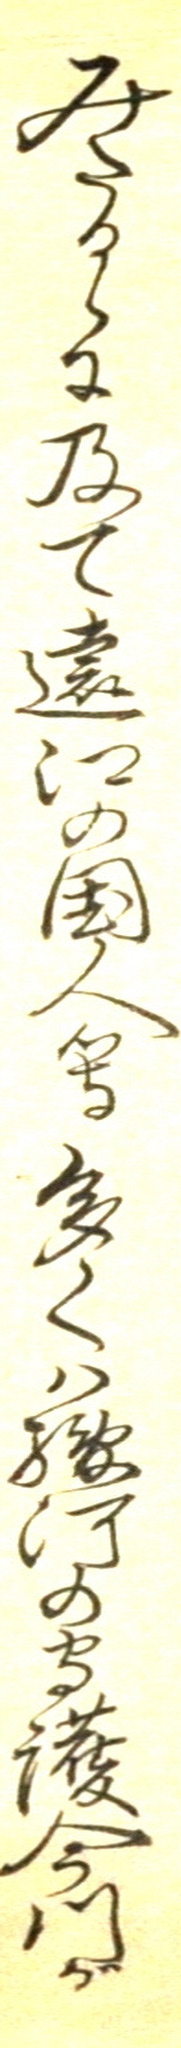みたるゝに及て遠江の国人等多くは駿河の守護今川が
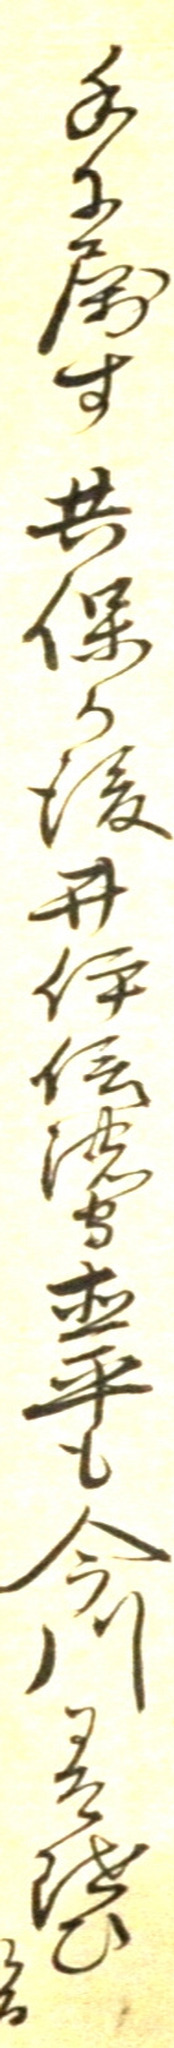手に属す共保か後井伊信濃守直平も今川にそ随ひける
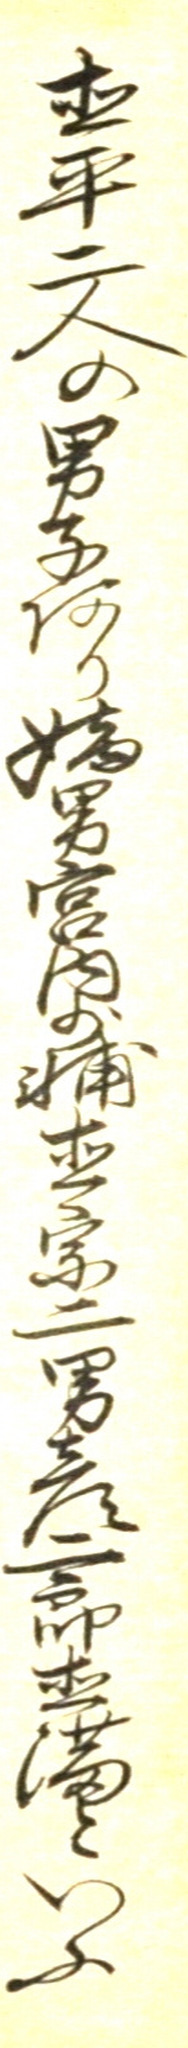直平二人の男子あり嫡男宮内少輔直宗二男彦二郎直満といふ
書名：藩翰譜（四・上）
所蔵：伊那市立高遠町図書館・合同会社AMANE
